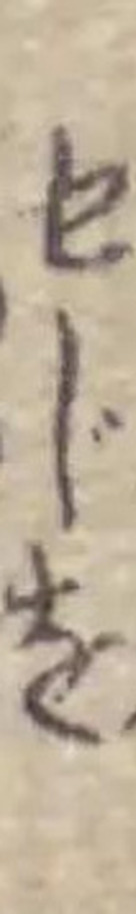せじを
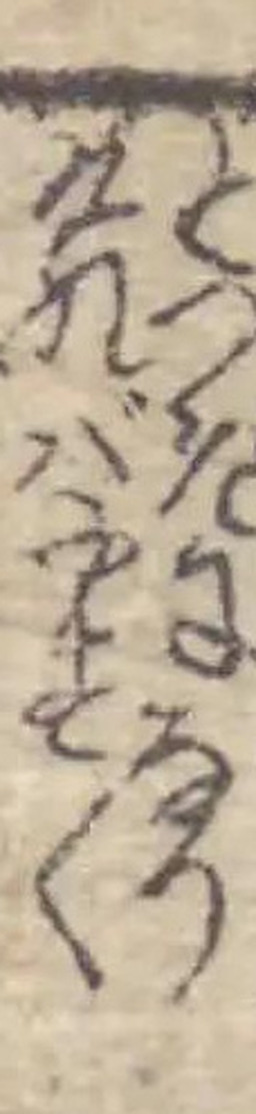ければやす〳〵
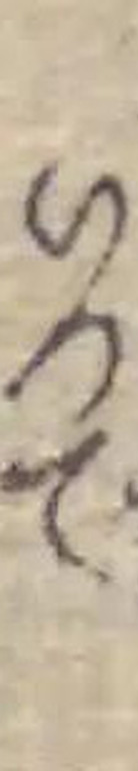いつて
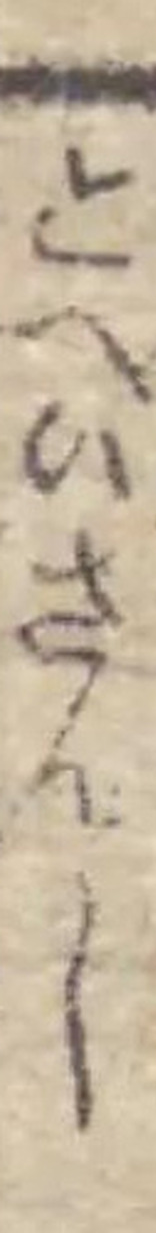とへいさんし
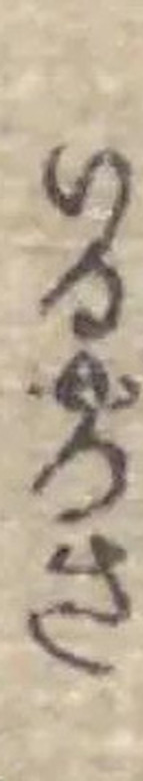いるやつさ
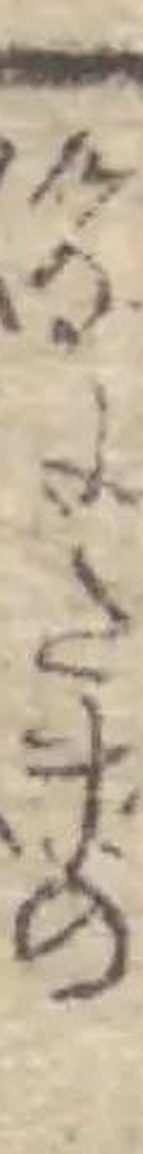けるにたまの
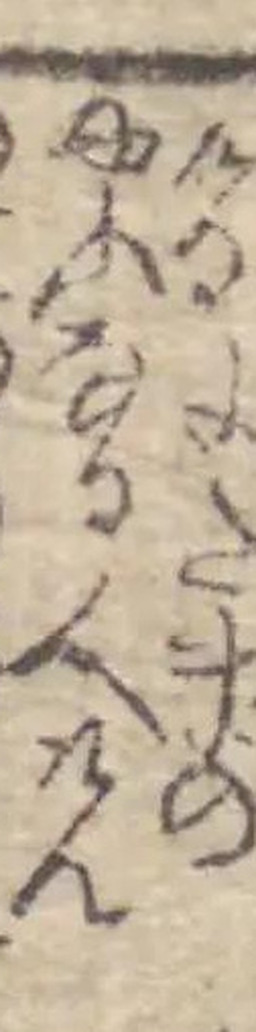やふなる人けん
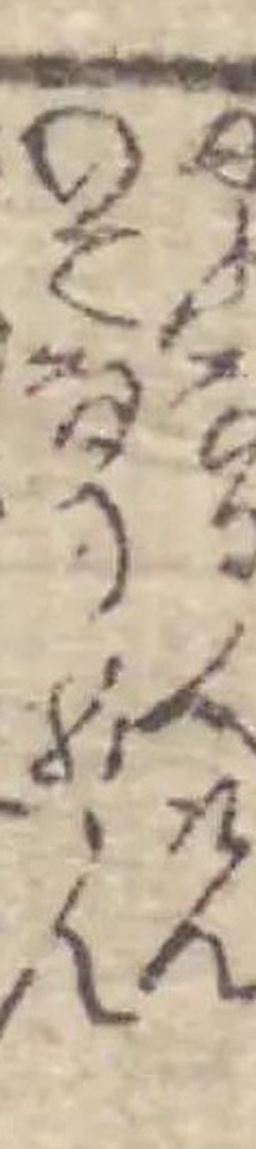のこなりもゝん
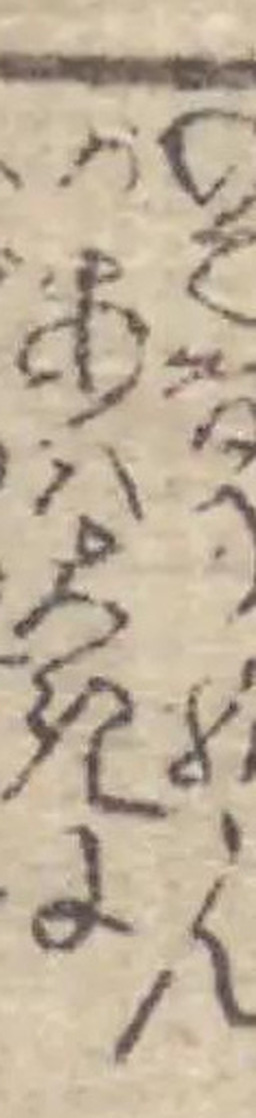があは大きに
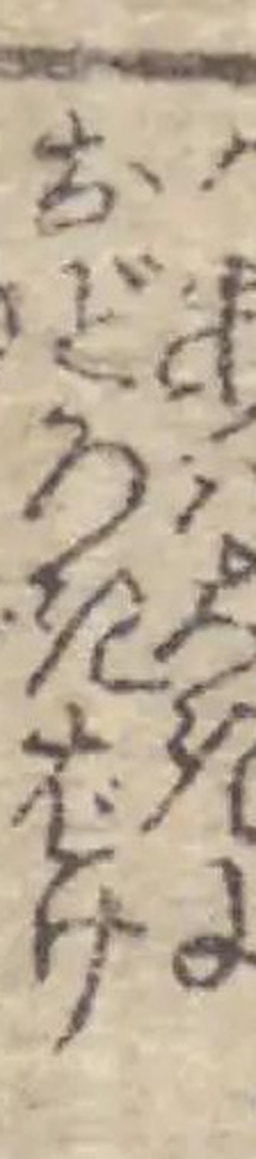おどろきばけ
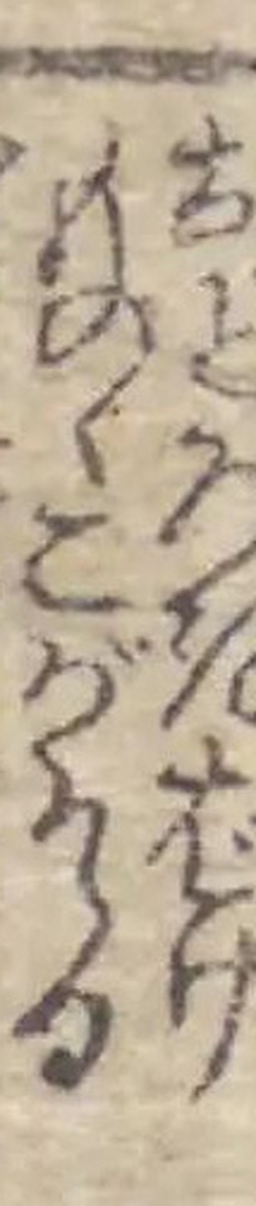ものゝこがかゝる
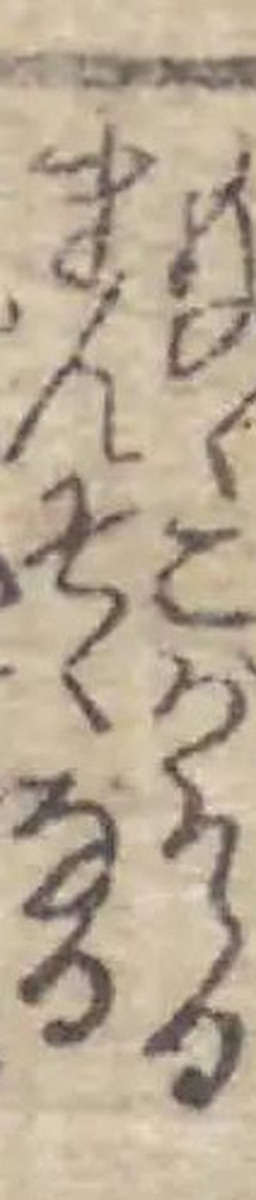まんそくなる
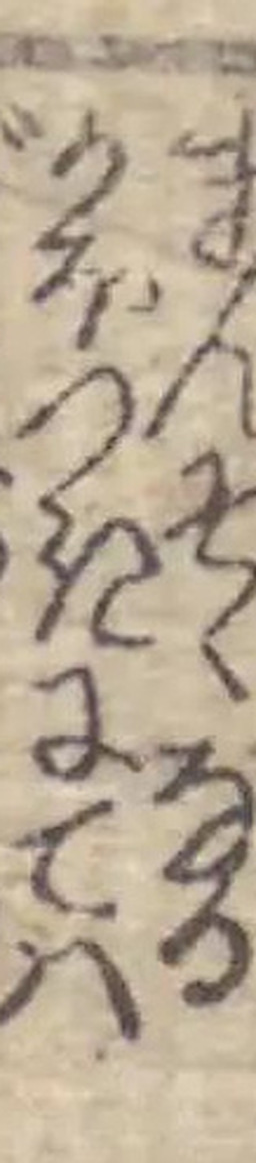かほつきにては
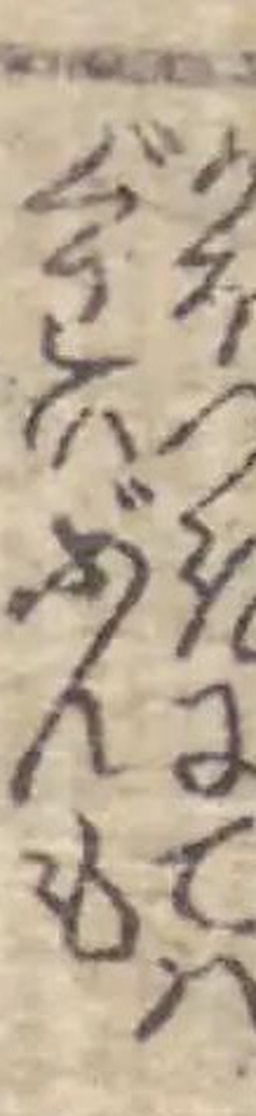ぐわいぶんも
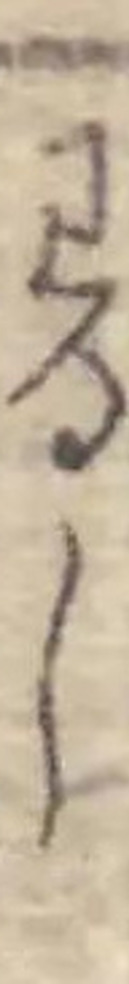わるし
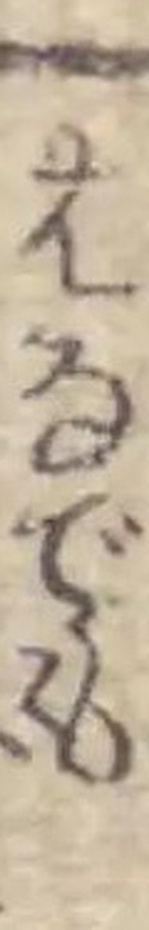はなでも
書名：化物尽 4巻
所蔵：国立国会図書館 National Diet Library, JAPAN
